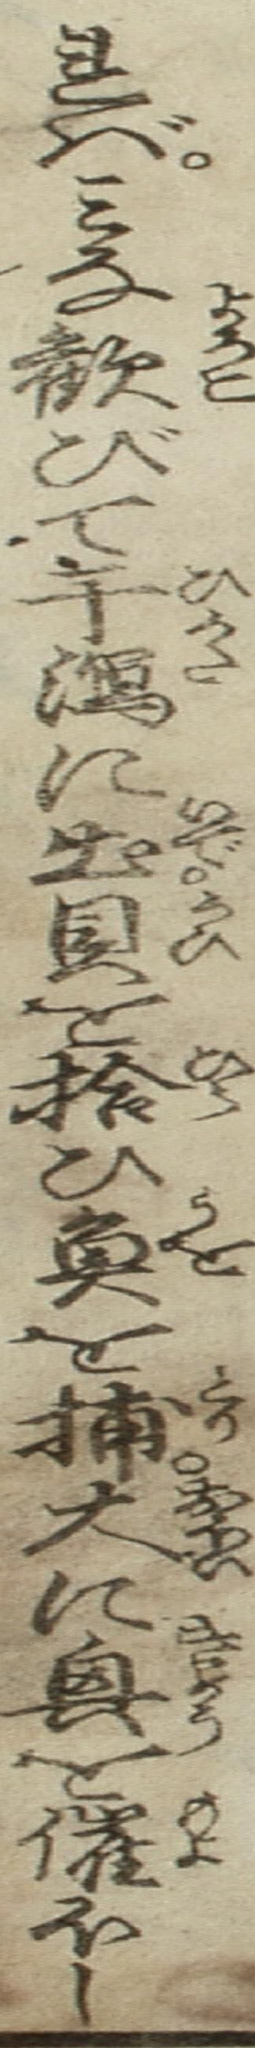れば。みな歓びて干潟に出。貝を拾ひ魚を捕。大に興を催ほし
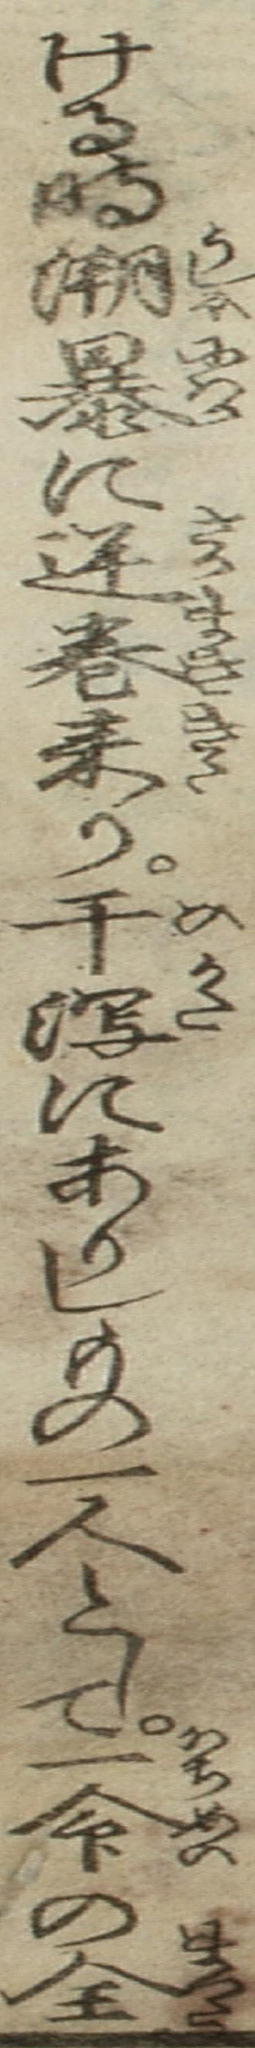ける時潮暴に逆巻来り。干潟にありしもの一人として。一命の全
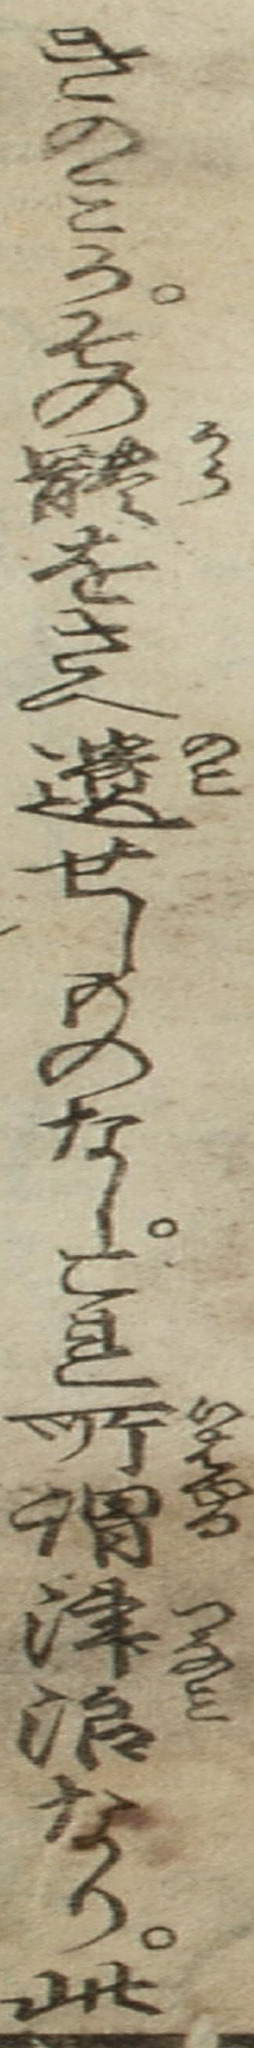きのみか。その體をさへ遺せしものなし。これ所謂津浪なり。此
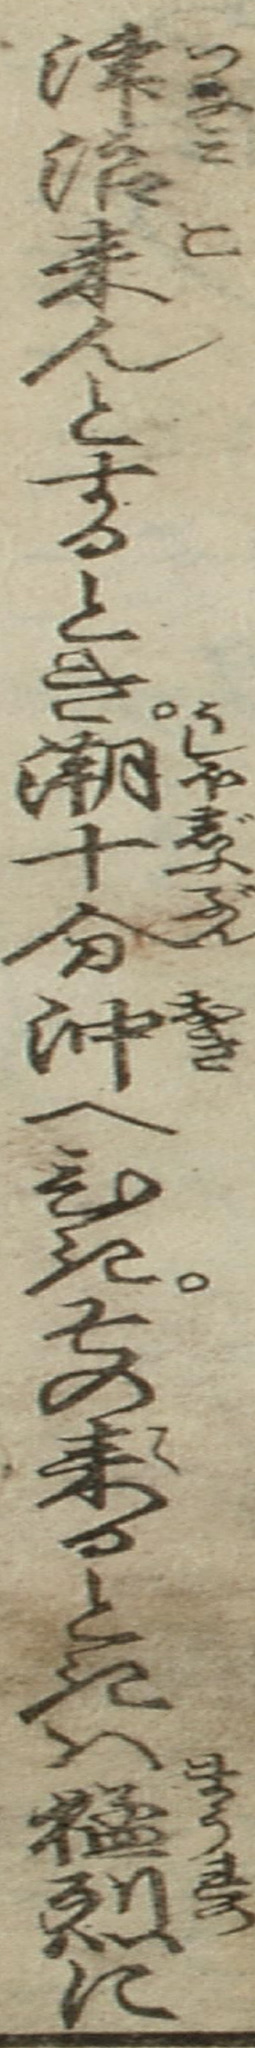津浪来んとするとき。潮十分沖へひき。その来るときは猛烈に
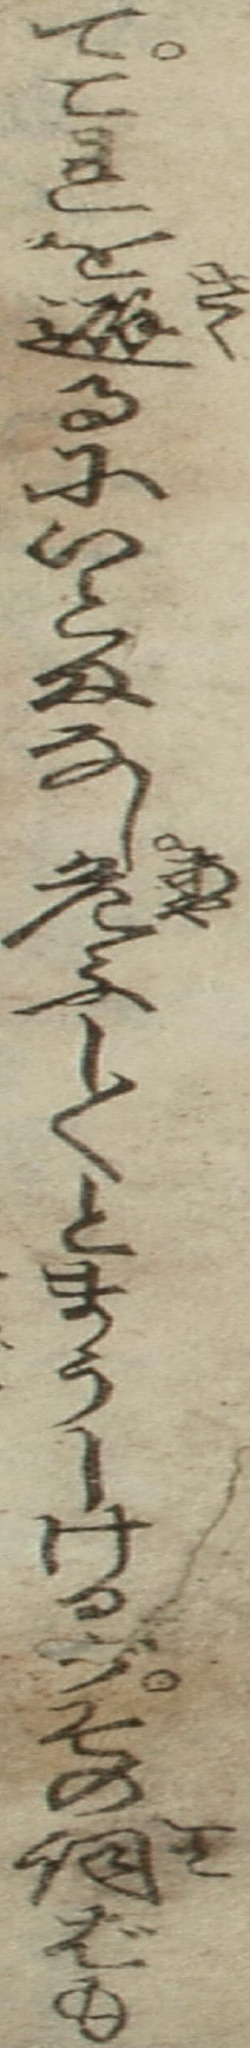て。これを避るにいとまなし。危ふし〳〵とまうしけるが。その詞ばも
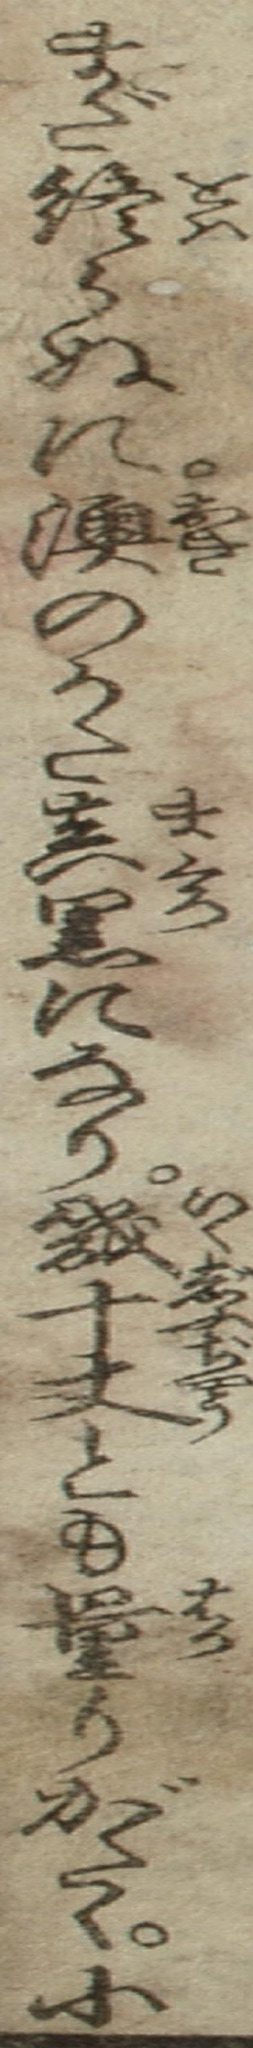まだ終らぬに。澳のかた真黒になり。幾十丈とも量りがたく。小

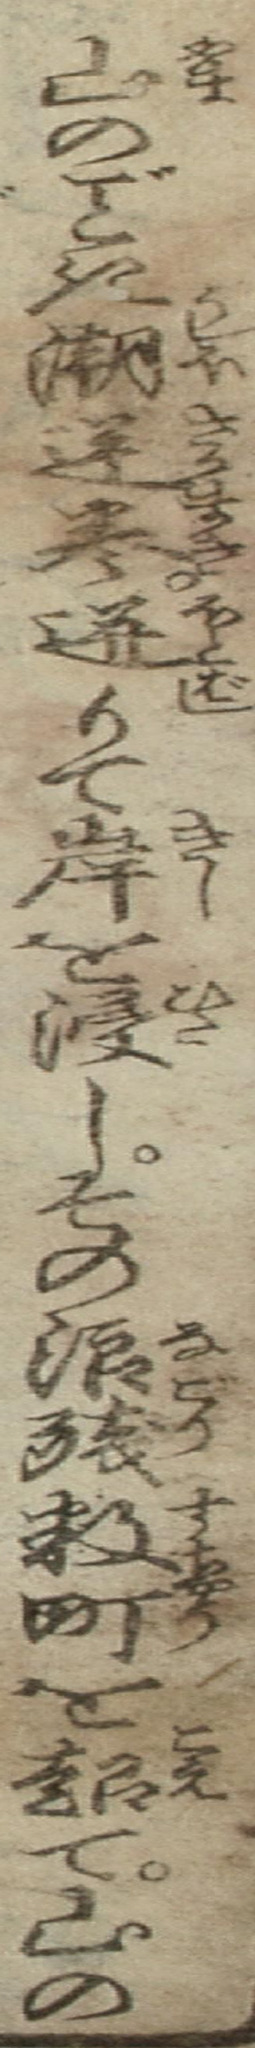山のごとき潮逆巻。迸りて岸を浸し。その浪残数町を超て。山の
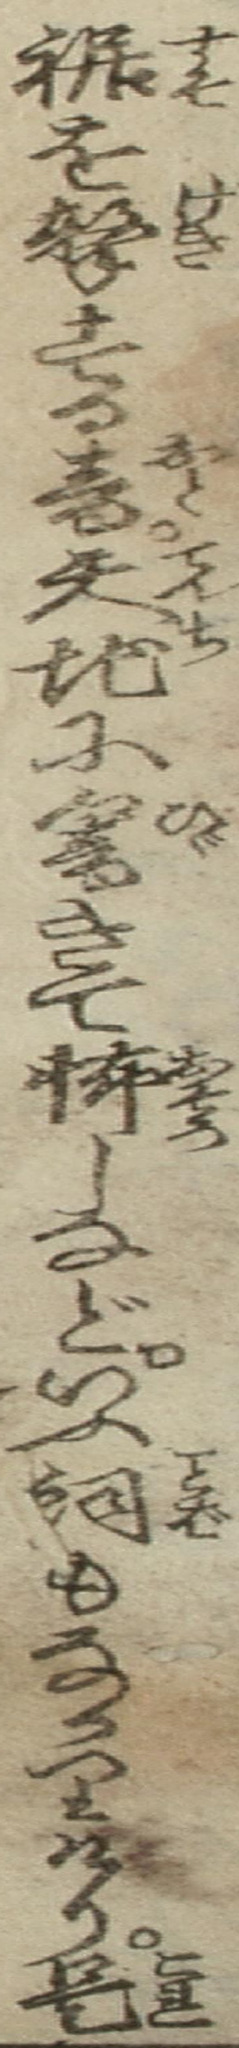裾を撃する音。天地に響きて怖しなど。いふ詞もなかりけり。是
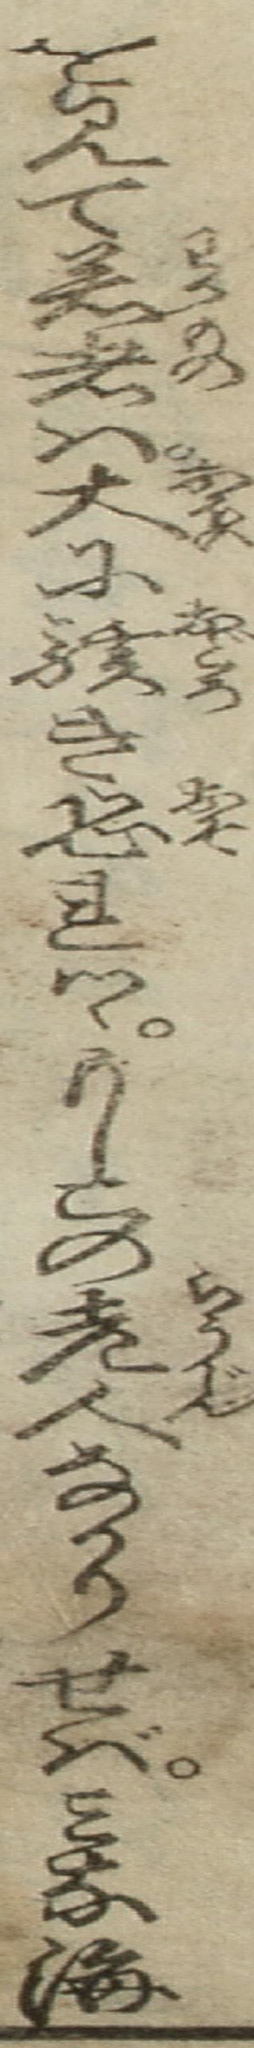を見て若者は大に駭き恐れツヽ。もしこの老人なかりせば。みな
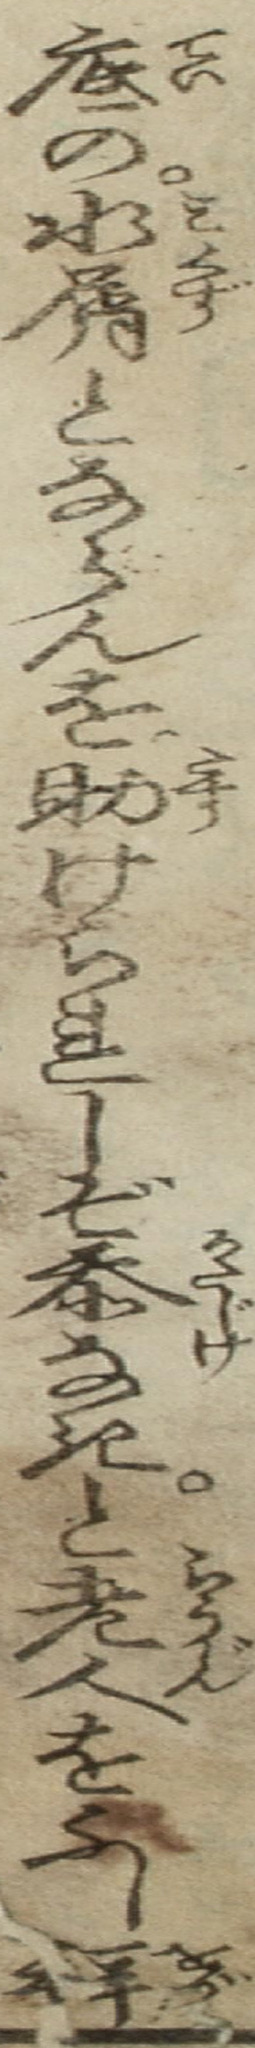底の。水屑とならんを助けられしぞ忝なき。と老人をふし拝
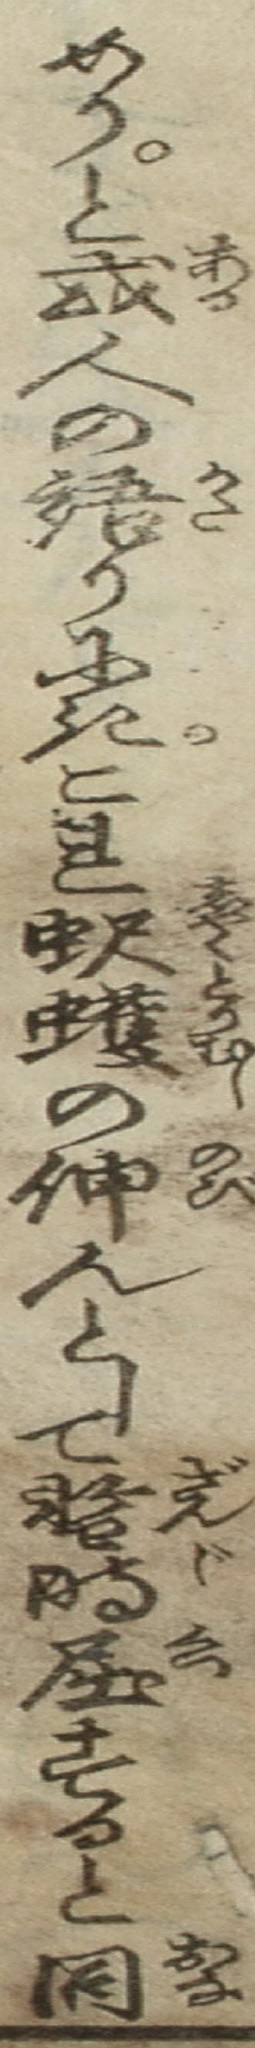めり。と或人の語りにき。これ蚇蠖の伸んとして暫時屈すると同蓆
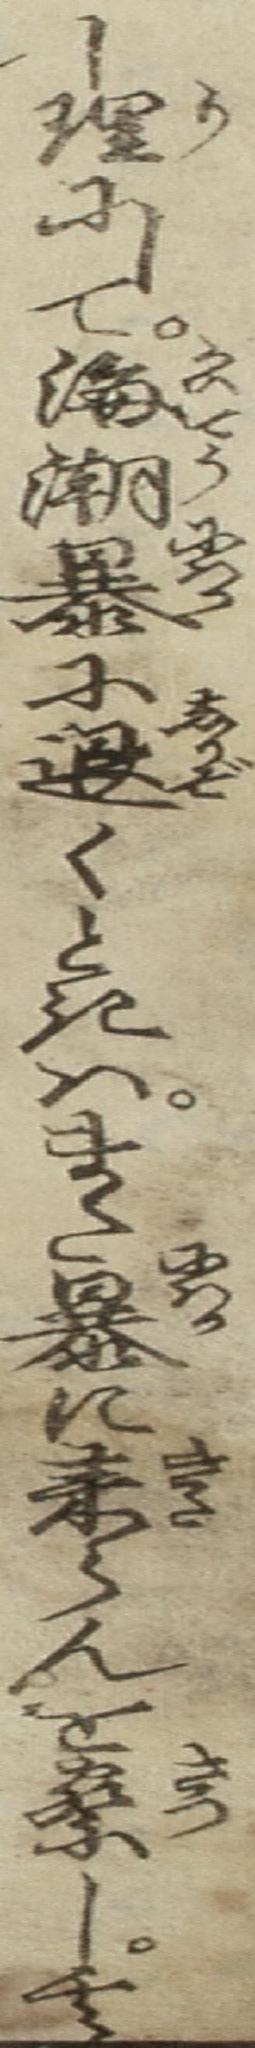し理にして。海潮暴に退くときは。また暴に来らんを察し。其
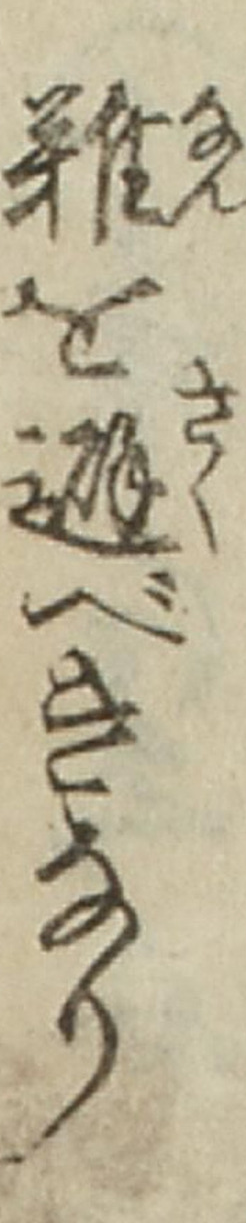難を避べきなり
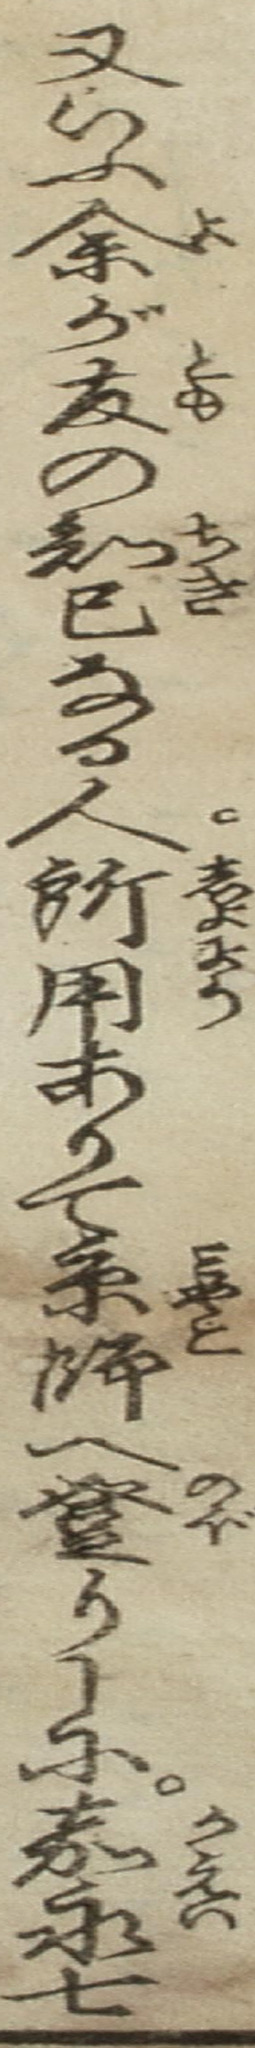又いふ余が友の知己なる人。所用ありて京師へ登りしに。嘉永七
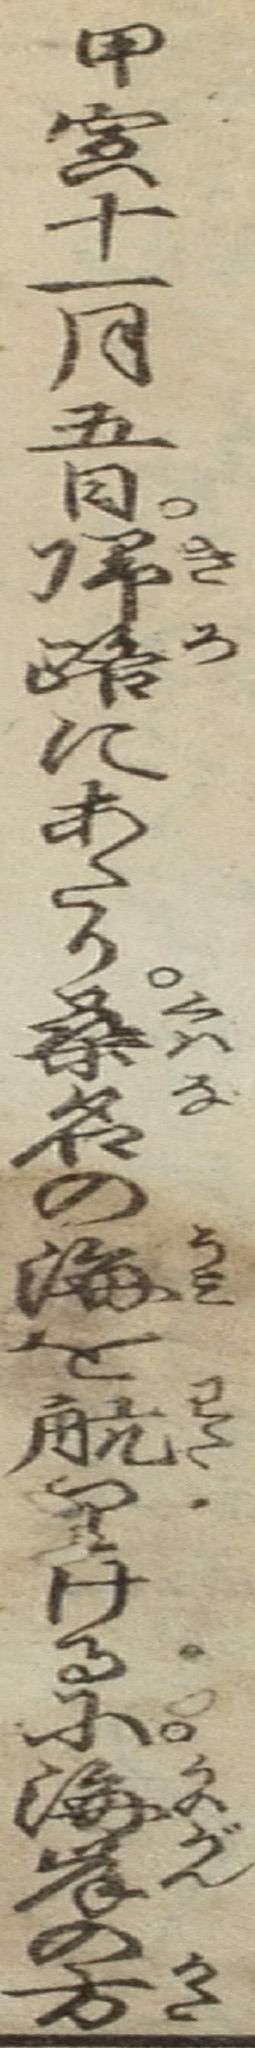甲寅十一月五日。帰路にあたり。桑名の海を航りけるに。海岸の方
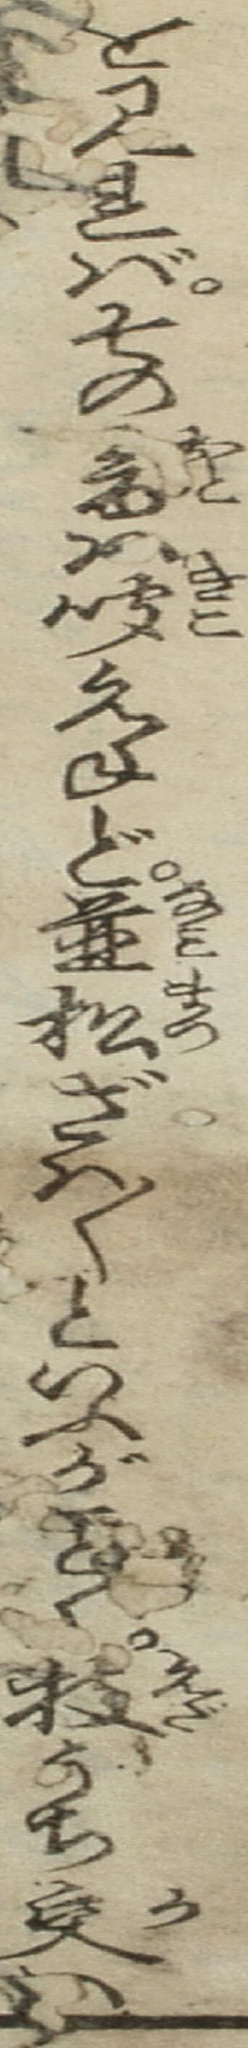を見れば。その音は聞えねど。並松ざは〳〵といふがごとく。枝うち交は
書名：安政見聞録　中
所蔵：東京大学地震研究所図書室 Earthquake Research Institute Library, The University of Tokyo, JAPAN
